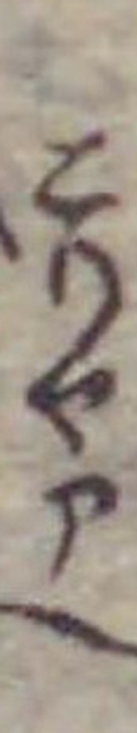こりやァ
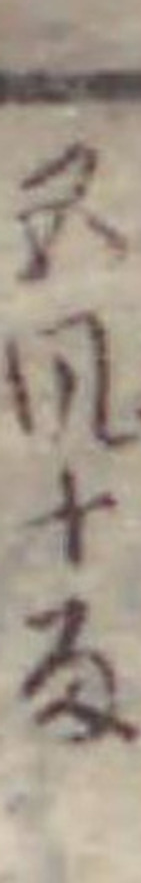五風十雨
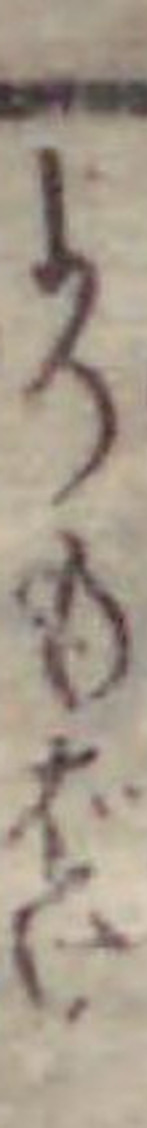よりもばけ
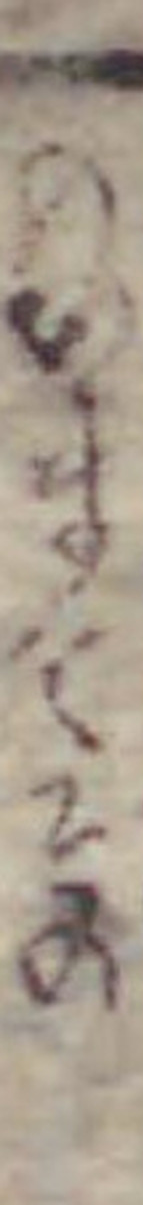ものまてその
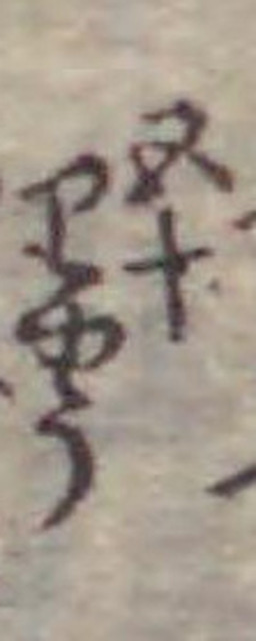りやう
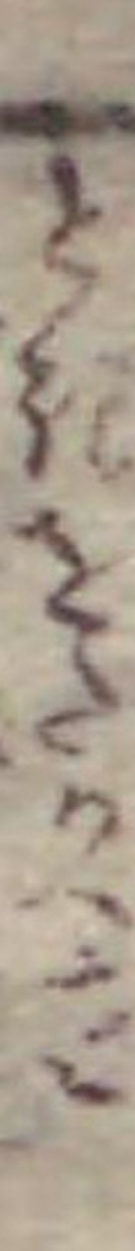ときをたかへす
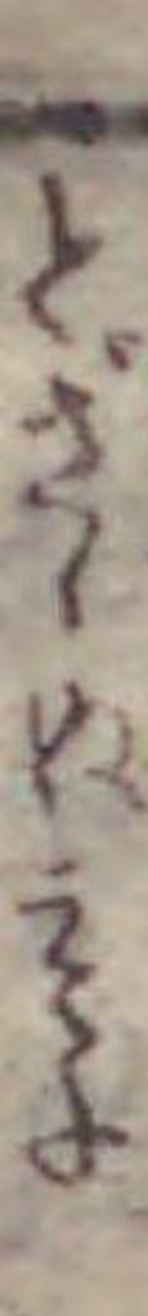とざゝぬみよ
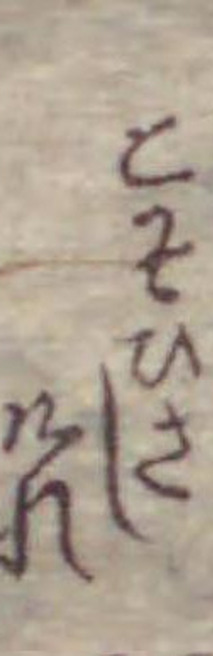こそひさ
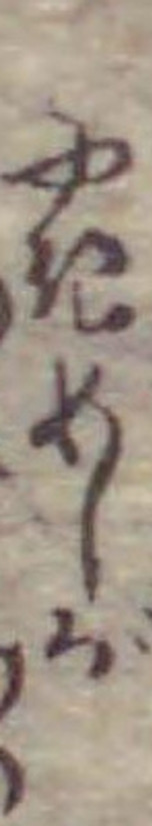やきめしが
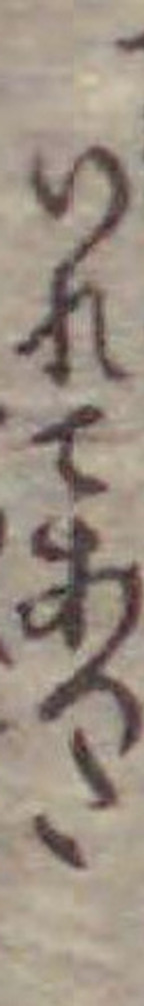いれてあつた
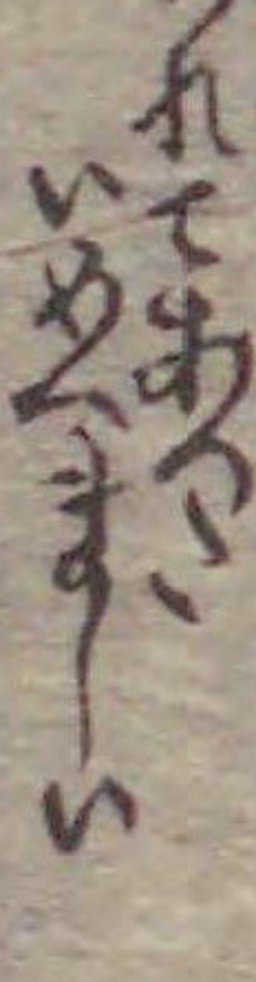いめへましい

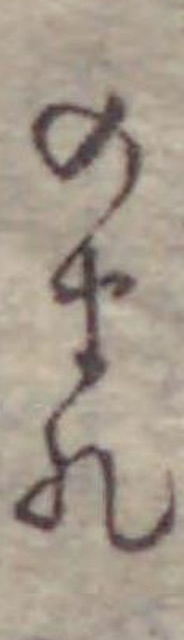のまれ
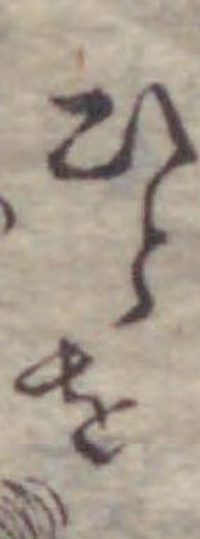ひとを
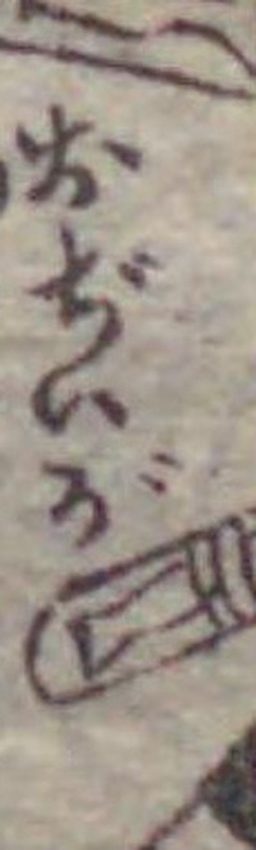おぢいが
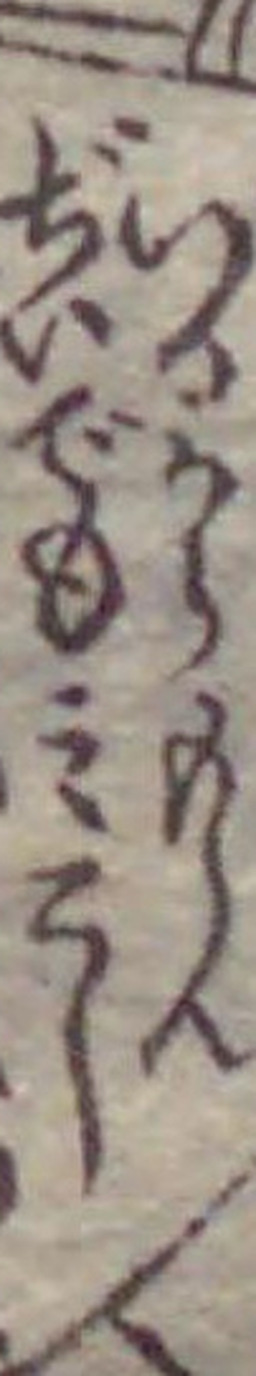ぢいでもみこし
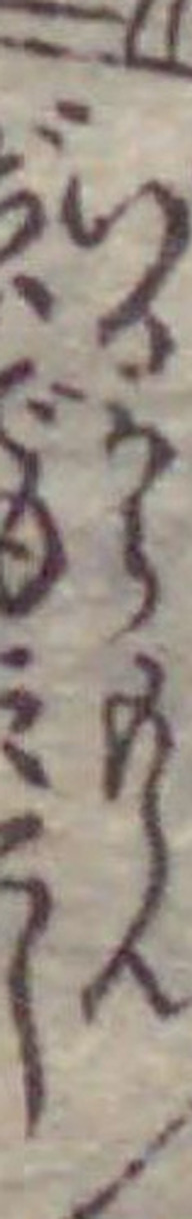ぢいでもみこし
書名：化物見世開 : 2巻
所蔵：国立国会図書館 National Diet Library, JAPAN
